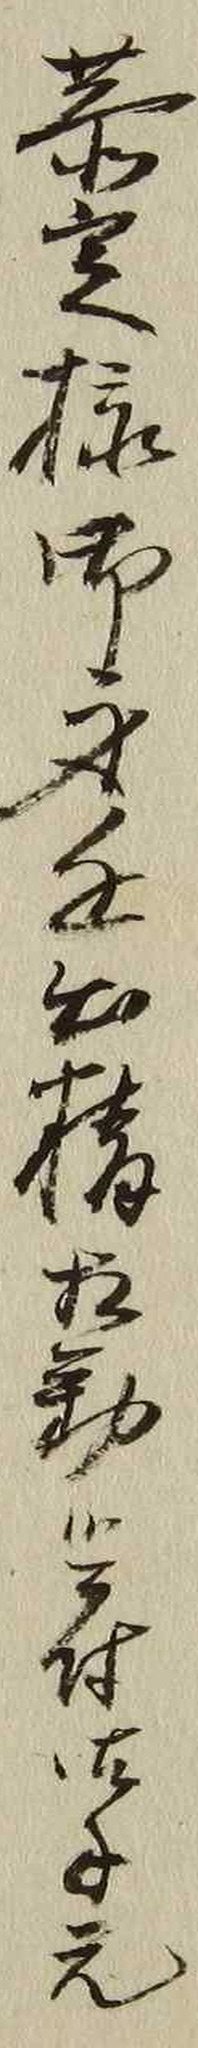恭定様御身近出精相勤候ニ付御手元
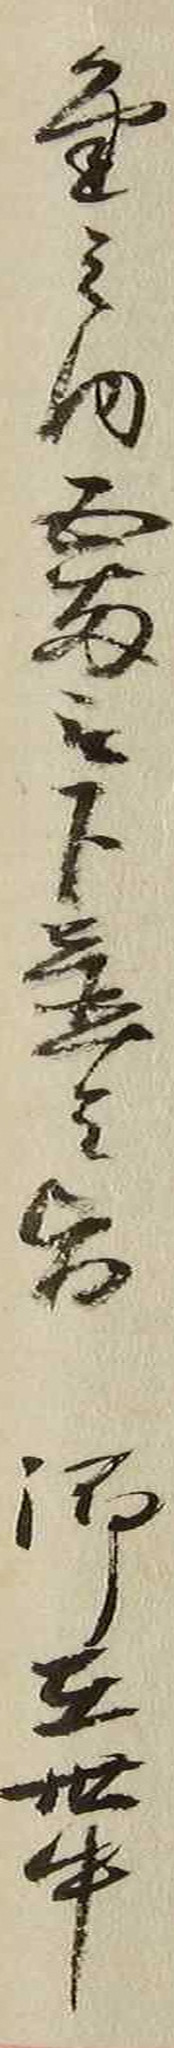金之内五両被下置之旨御在世中
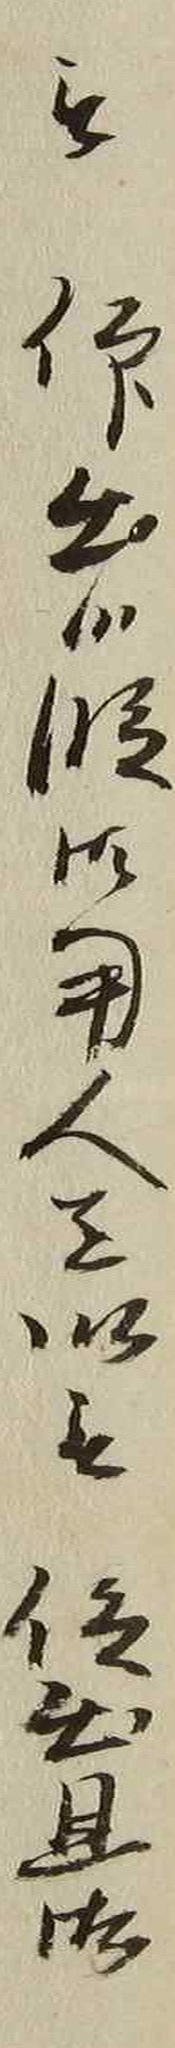被仰出候段御用人を以被仰出且御
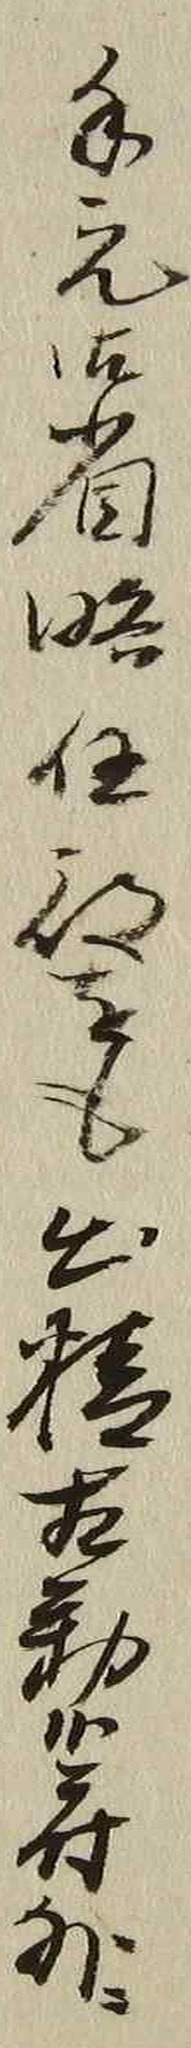手元御省略任役をも出精相勤候ニ付外ニ
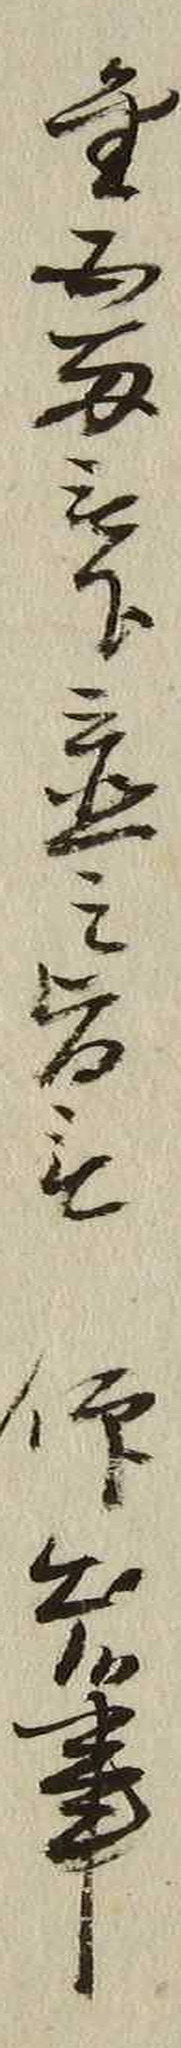金五両被下置之旨被仰出候事
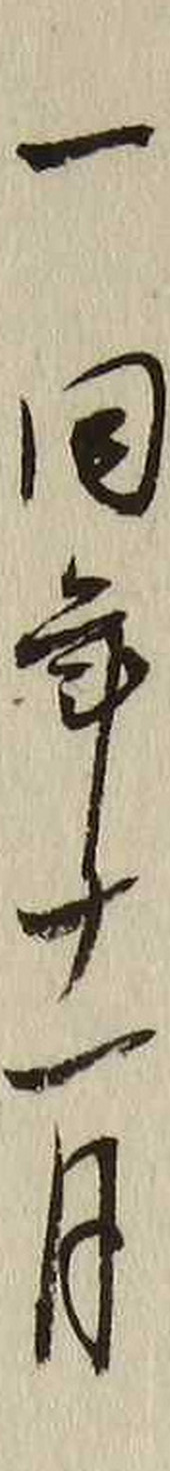一同年十一月
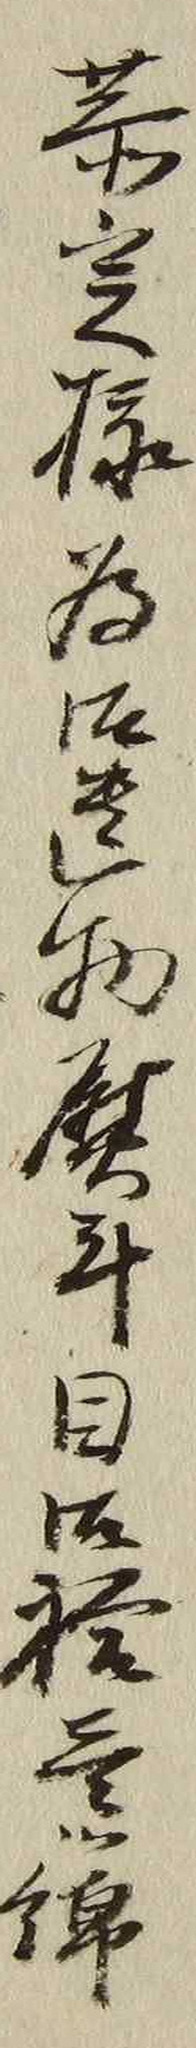恭定様為御遺物熨斗目御袷壱ツ綿
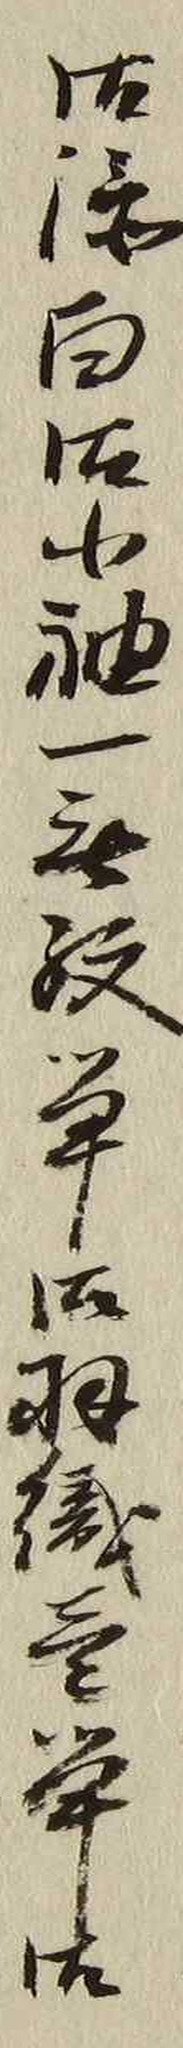御添白御小袖一無紋単御羽織壱単御
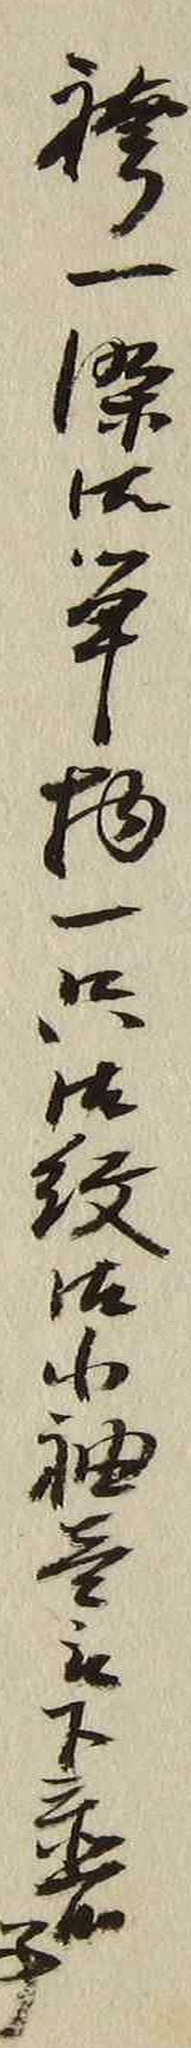袴一染単物一只御絞御小袖壱被下置候事
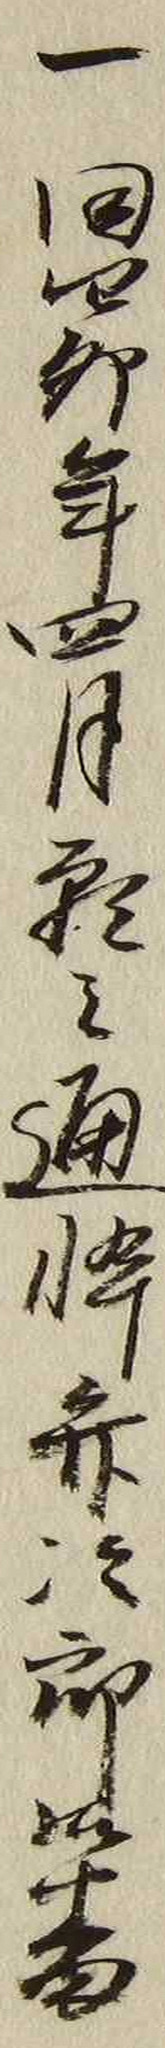一同四卯年四月願之通忰弁次郎御番
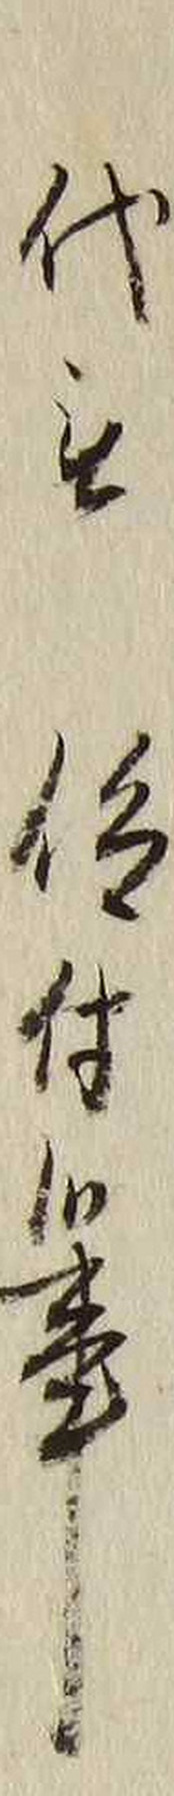代被仰付候事
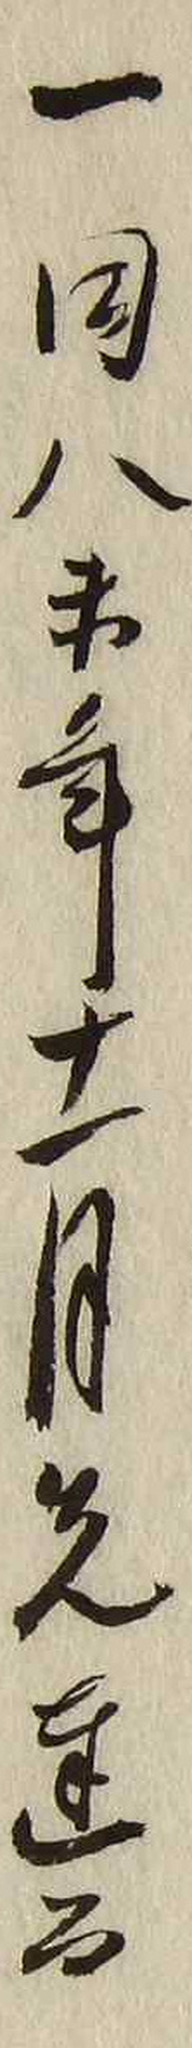一同八未年十一月先達而

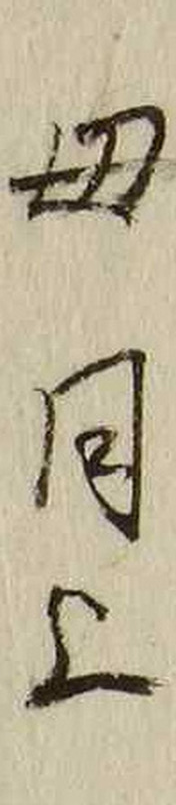母同上
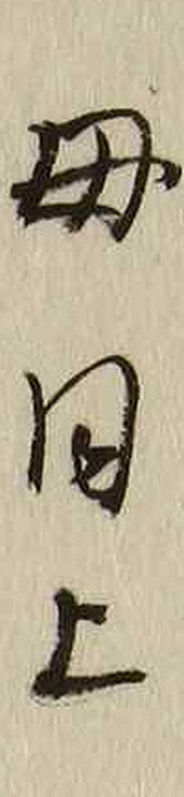母同上
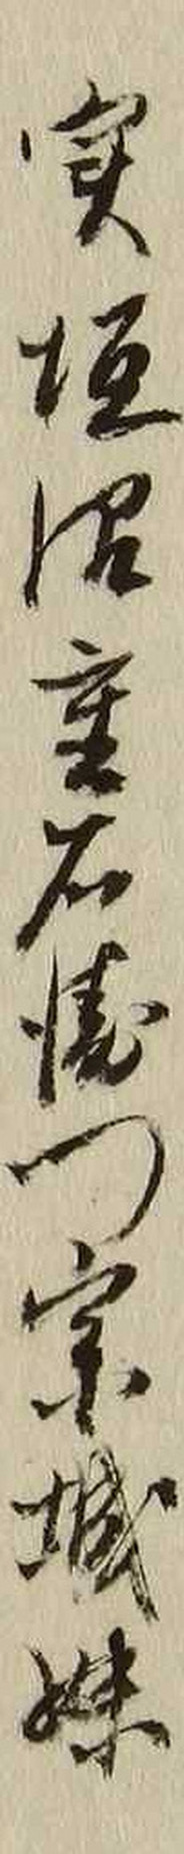実垣沼重右衛門宗城妹
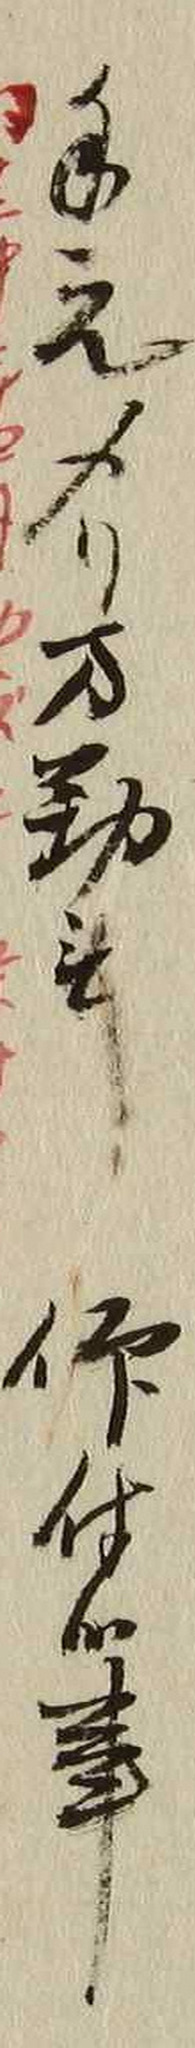手元〆り方勤被仰付候事
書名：諸士系譜　巻之345　も之部1
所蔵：会津若松市立会津図書館
